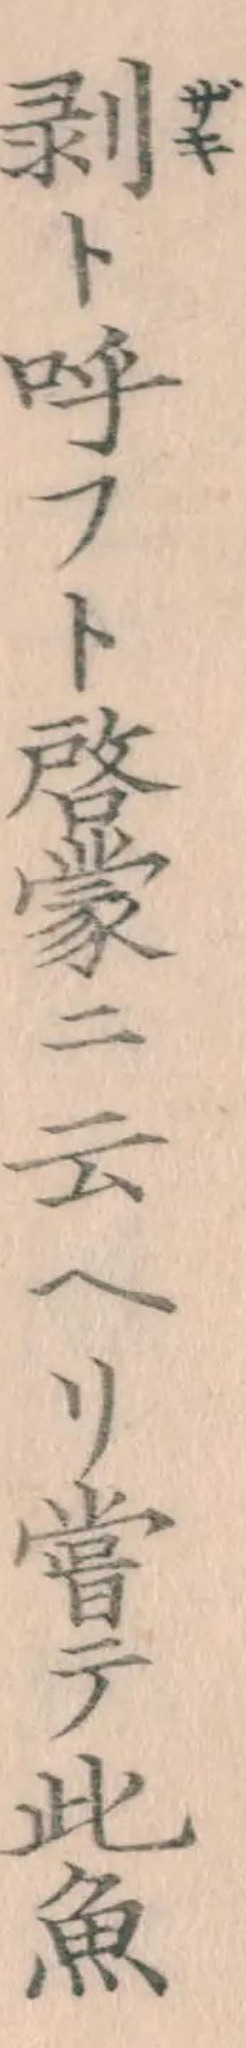剥ト呼フト啓蒙ニ云ヘリ嘗テ此魚
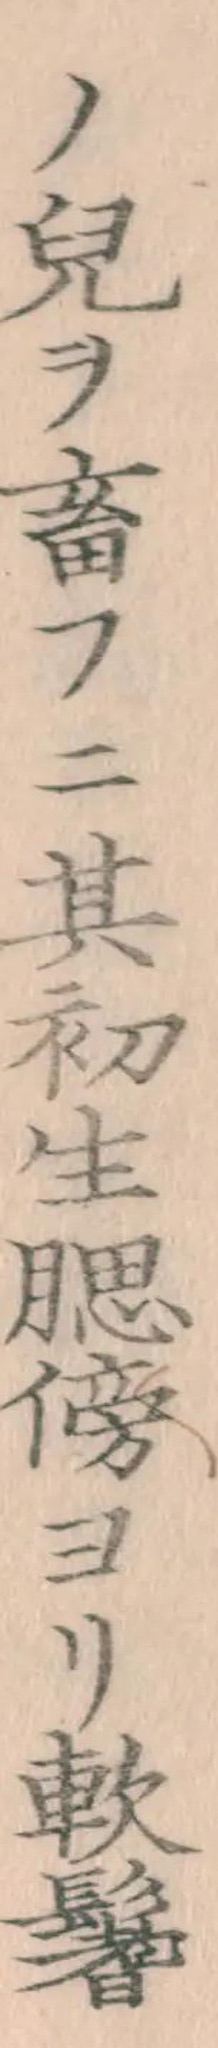ノ児ヲ畜フニ其初生腮傍ヨリ軟鬐
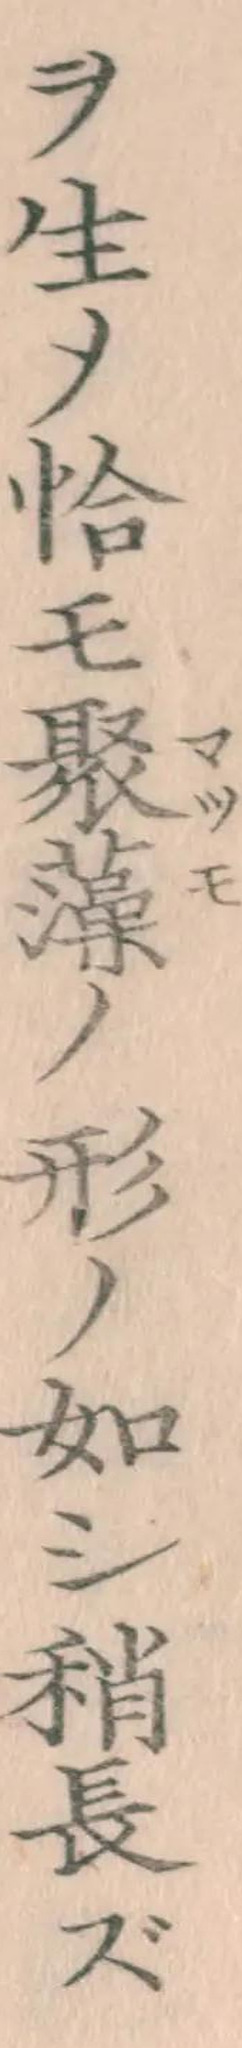ヲ生シテ恰モ聚藻ノ形ノ如シ稍長ズ
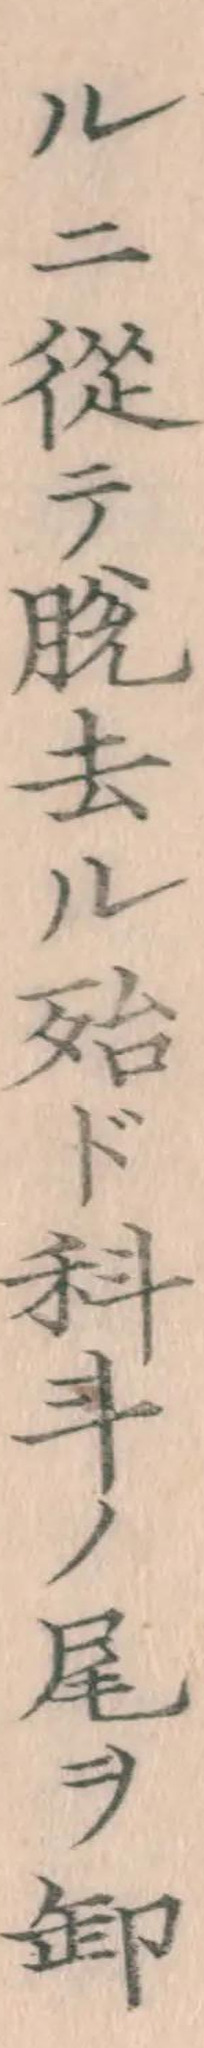ルニ従テ脱去ル殆ド科斗ノ尾ヲ卸
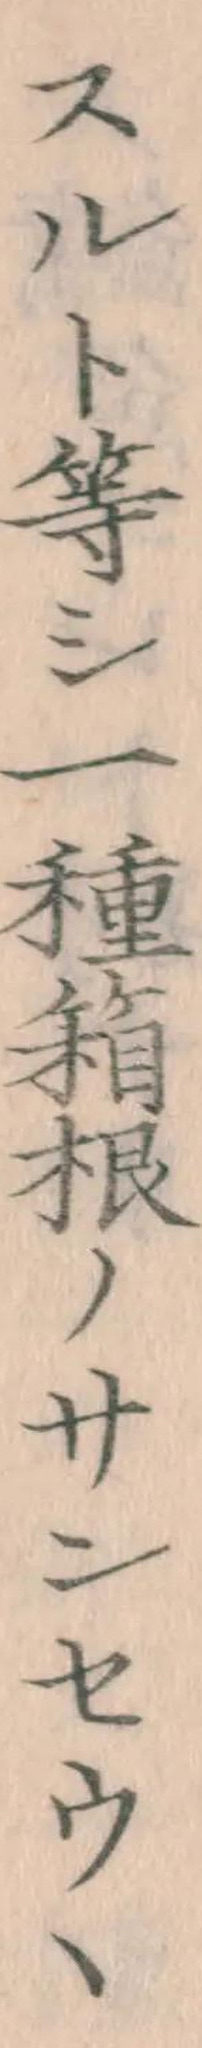スルト等シ一種箱根ノサンセウヽ
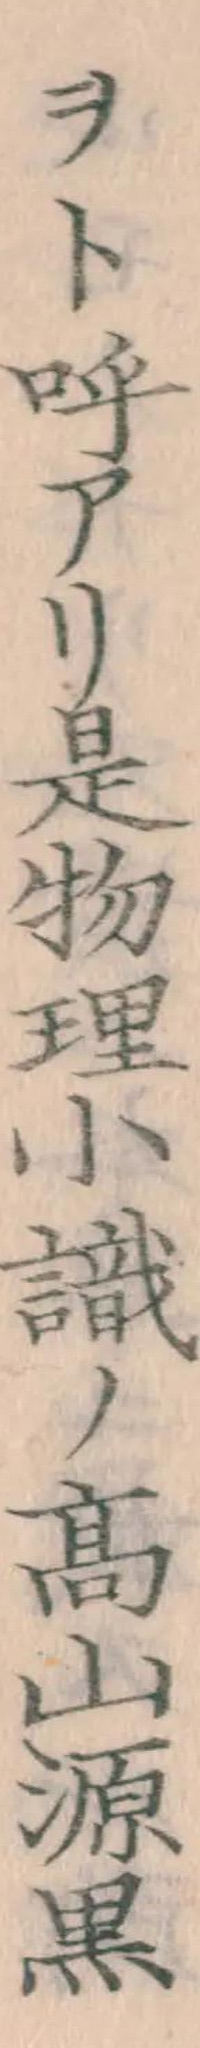ヲト呼アリ是物理小識ノ高山源黒
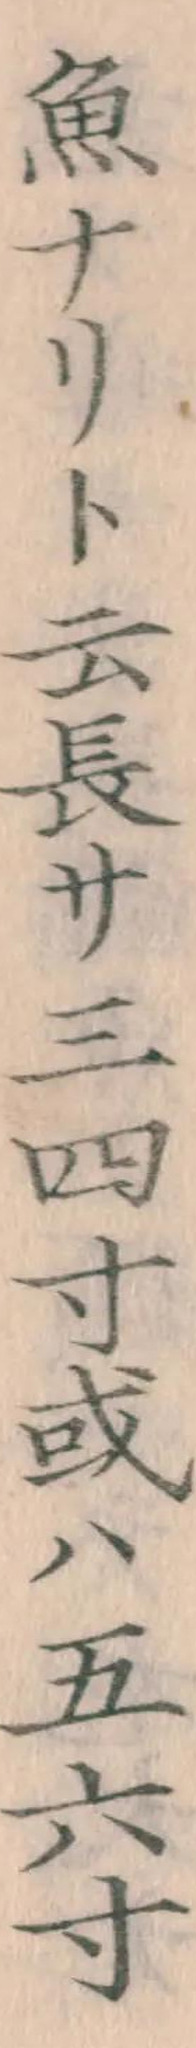魚ナリト云長サ三四寸或ハ五六寸
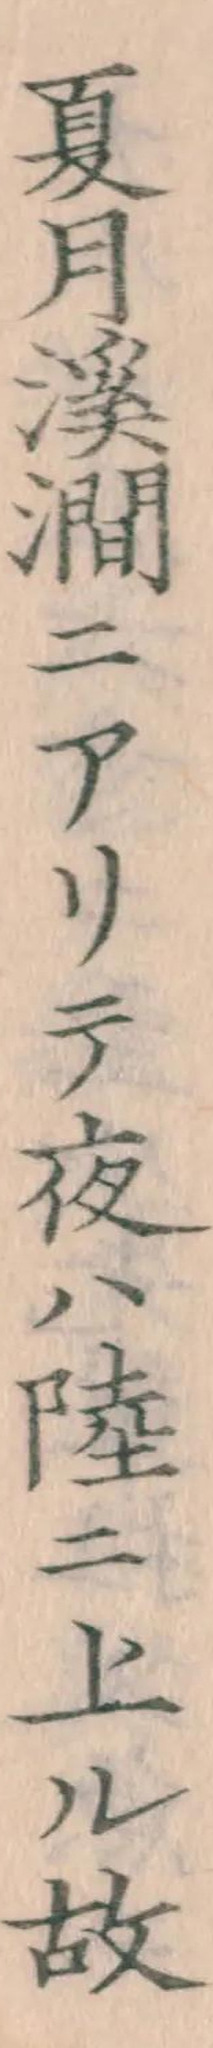夏月渓澗ニアリテ夜ハ陸ニ上ル故
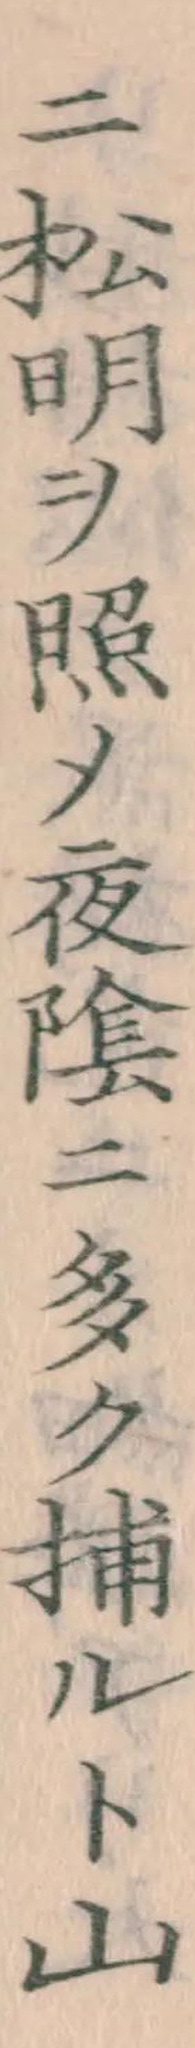ニ松明ヲ照シテ夜陰ニ多ク捕ルト山
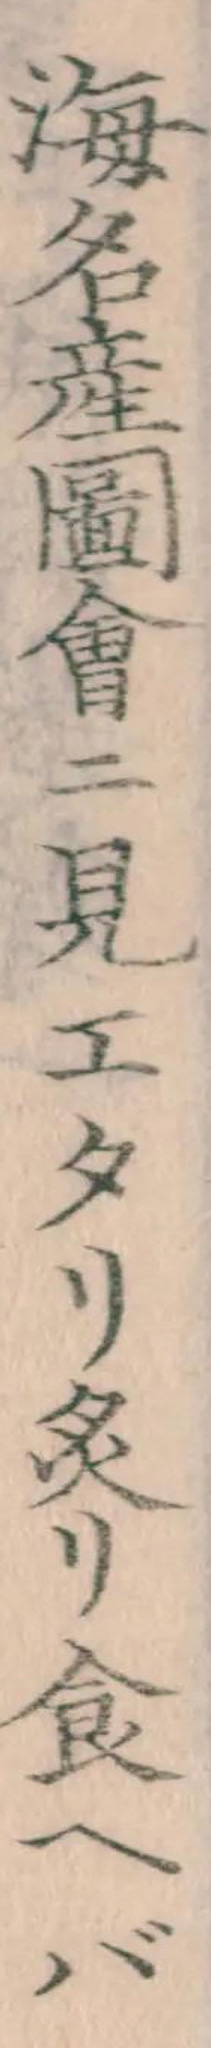海名産図会ニ見エタリ炙リ食へバ
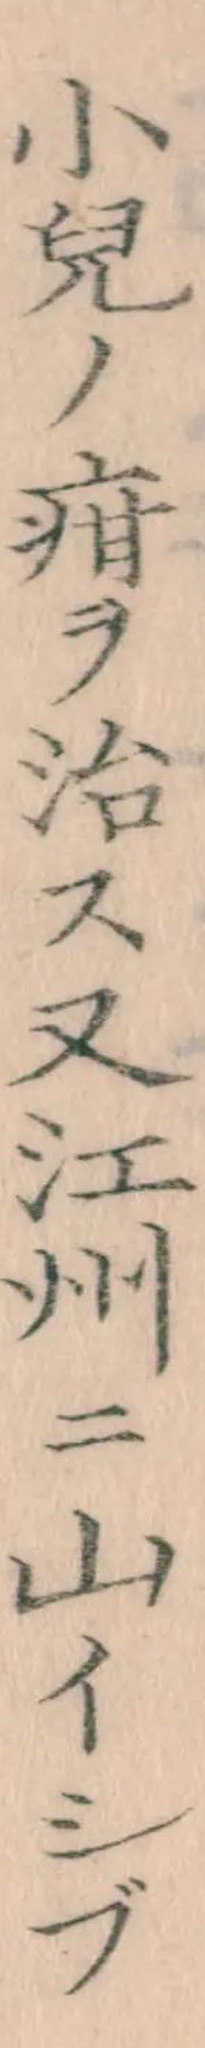小児ノ疳ヲ治ス又江州ニ山イシブ
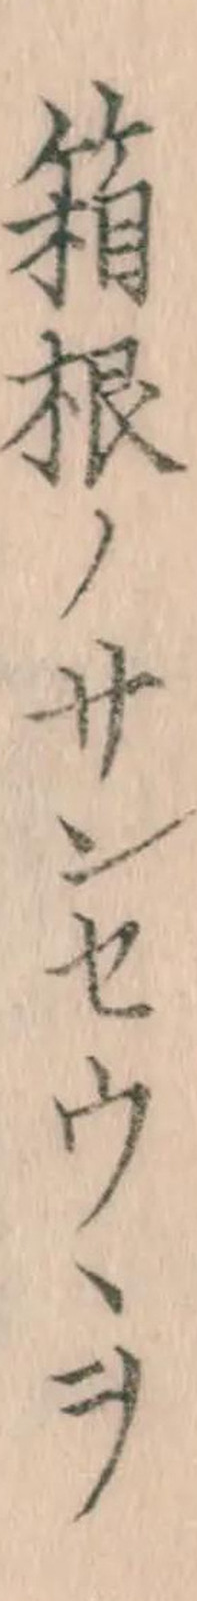箱根ノサンセウヽヲ
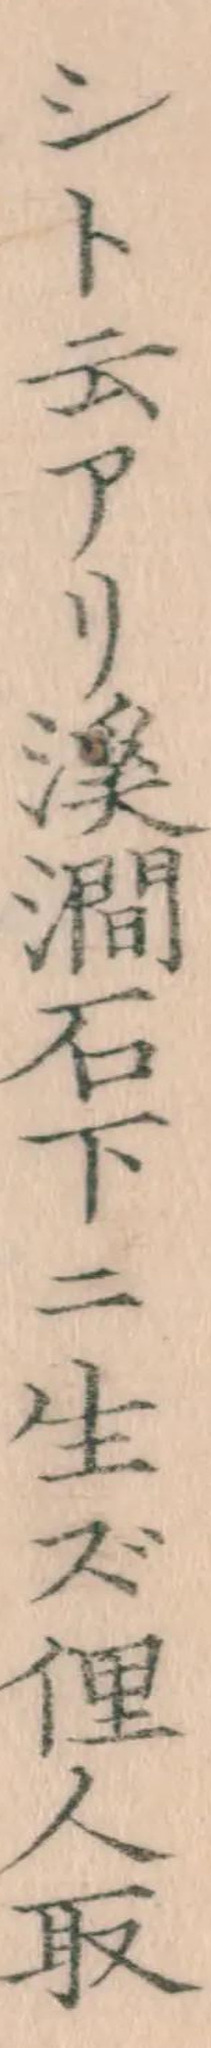シト云アリ渓澗石下ニ生ズ俚人取
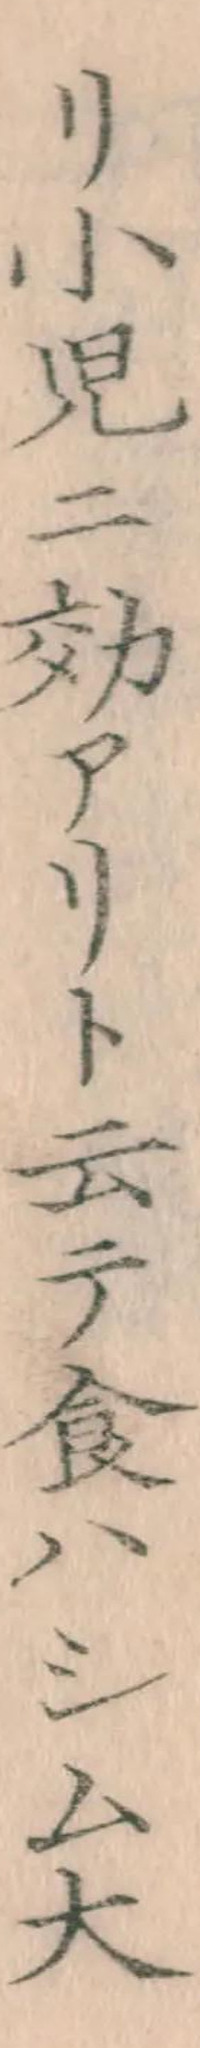リ小児ニ効アリト云テ食ハシム大
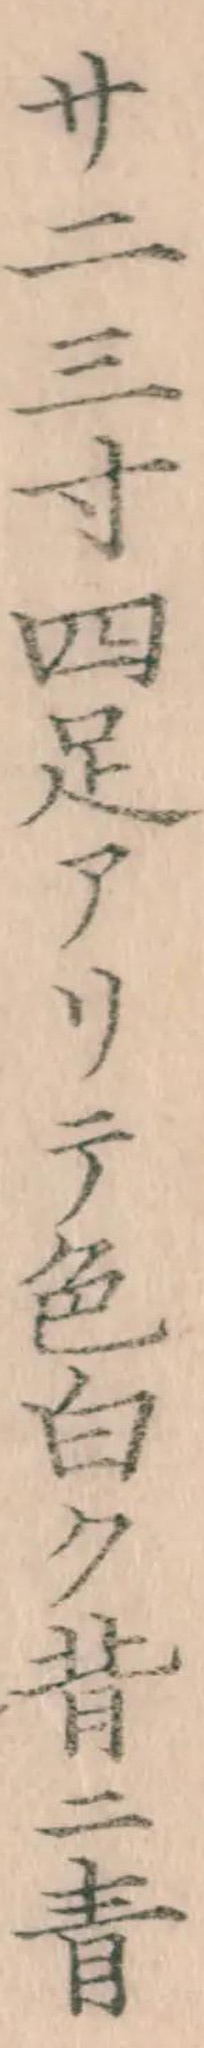サ二三寸四足アリテ色白ク背ニ青
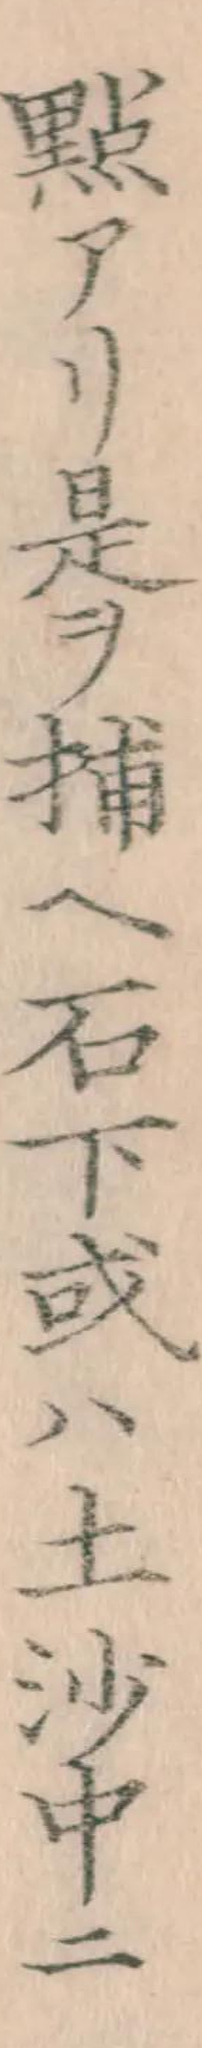点アリ是ヲ捕ヘ石下或ハ土沙中ニ
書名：皇和魚譜 2巻
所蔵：国立国会図書館 National Diet Library, JAPAN
